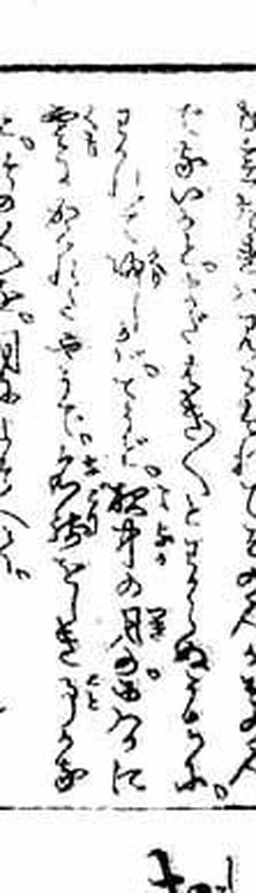わかれて帰しかばてうど夜中の月のやうに
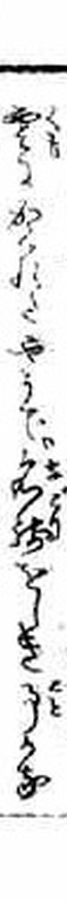雲にかくれたやうで名残をしき事かな部
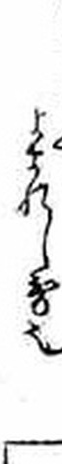よまれし哥也

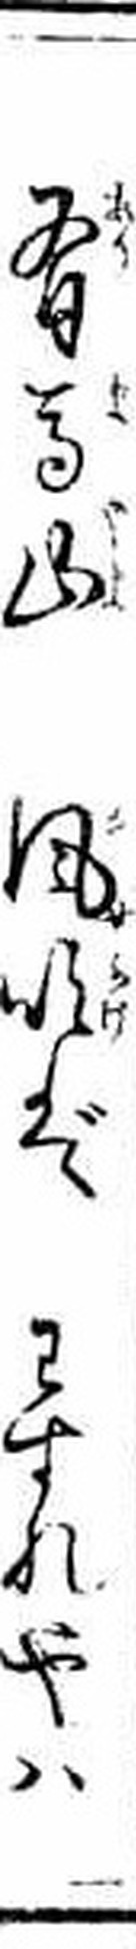有馬山風吹ばわすれやは
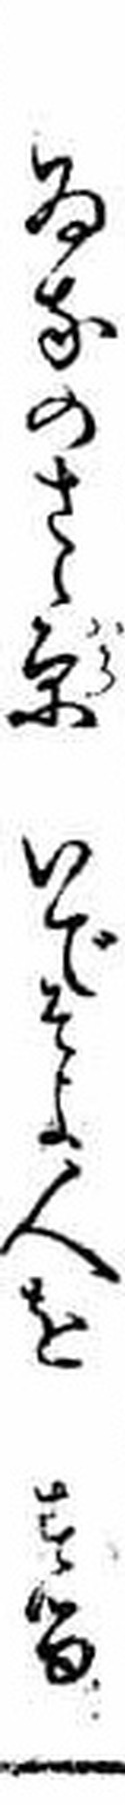ゐなのさゝ原いでそよ人をする
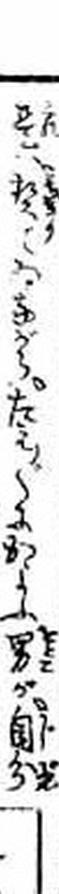是は契てゐながらたえ〴〵にかよふ男が自分
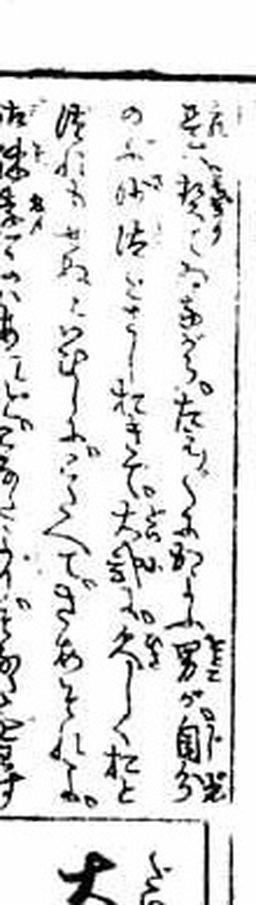の無沙汰をさしおきて大弐に久しくおと大弐
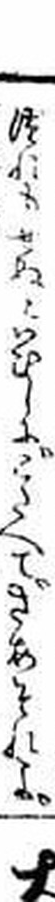つれもせぬといひしにこたへてさあそれに
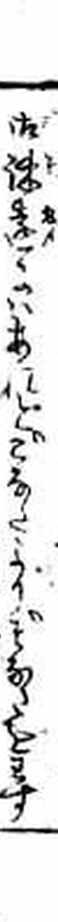御疎遠にはあれどこなたにそなたをわす
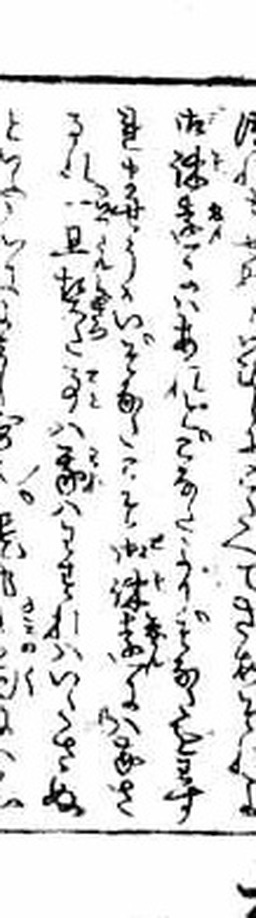れませうかいそなた御休意にはなさ三位
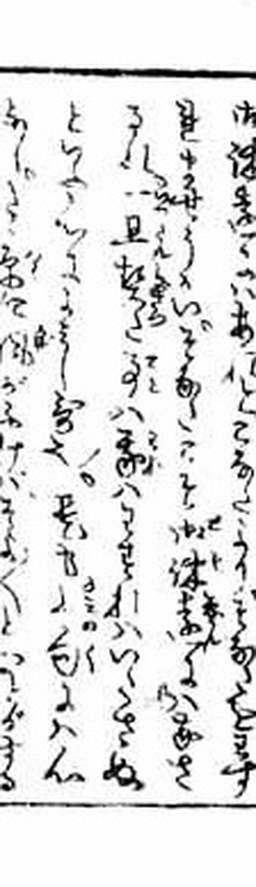るれ一旦契たる事は我はわすれはいたさぬ
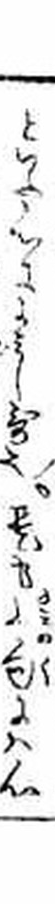といふ心によみし哥也是も上句は心
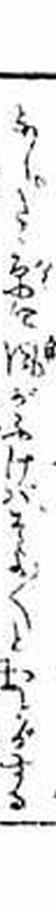なしさゝ原に風がふけばそよ〳〵とおとがする
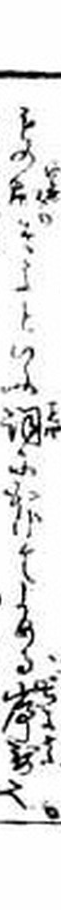ものぞよといふ詞にかけてよめる序詞也
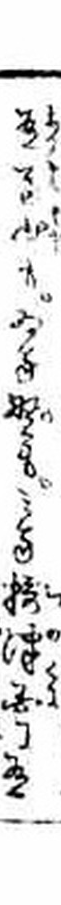有馬山もゐなのもみな摂津国に有
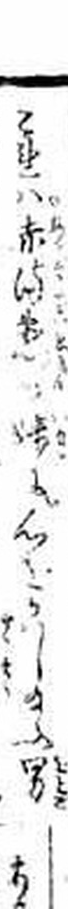これは赤満島の崎に心をかはし給ふ男
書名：小倉百人一首
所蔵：東京学芸大学教育コンテンツアーカイブ
